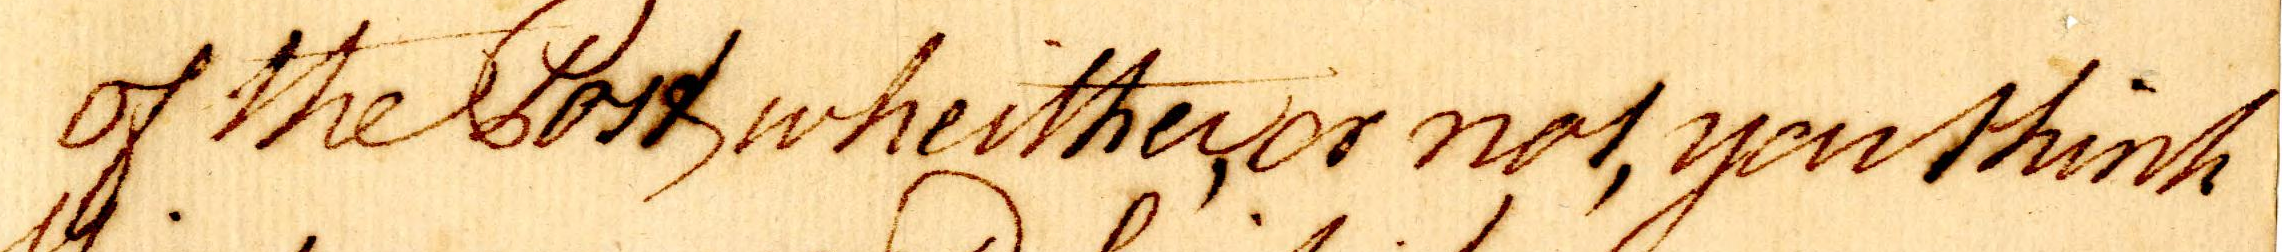of the Post whether, or not, you think
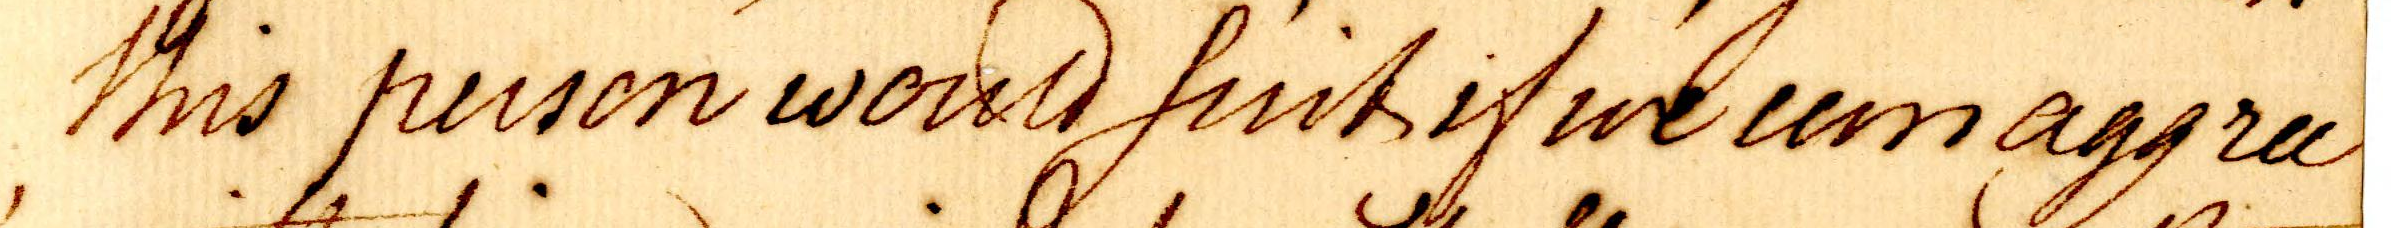this person would suit if we can aggree
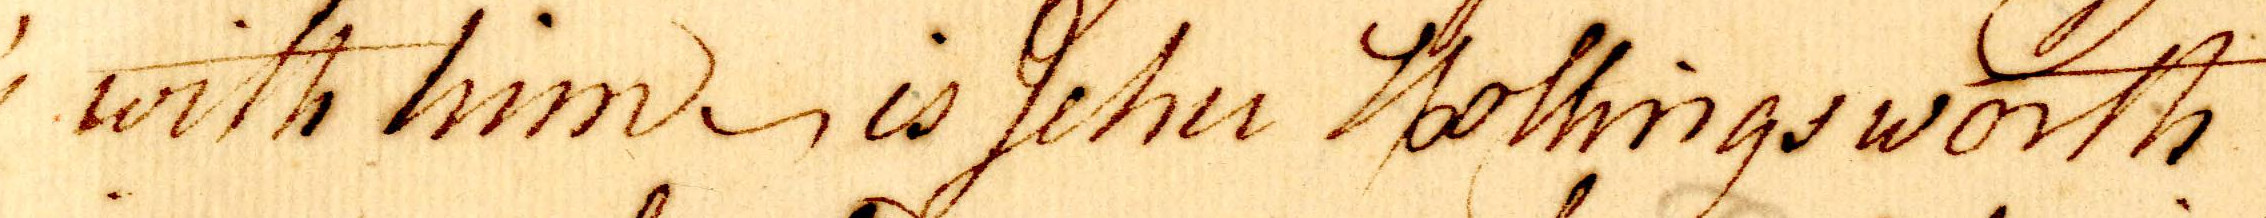with him, is John Hollingsworth
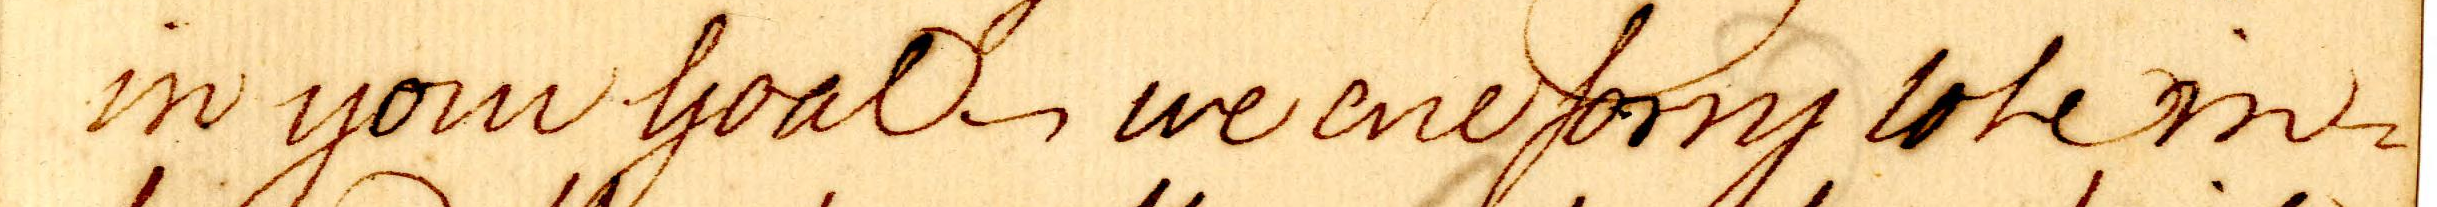in your Goal- We are sorry to be in-
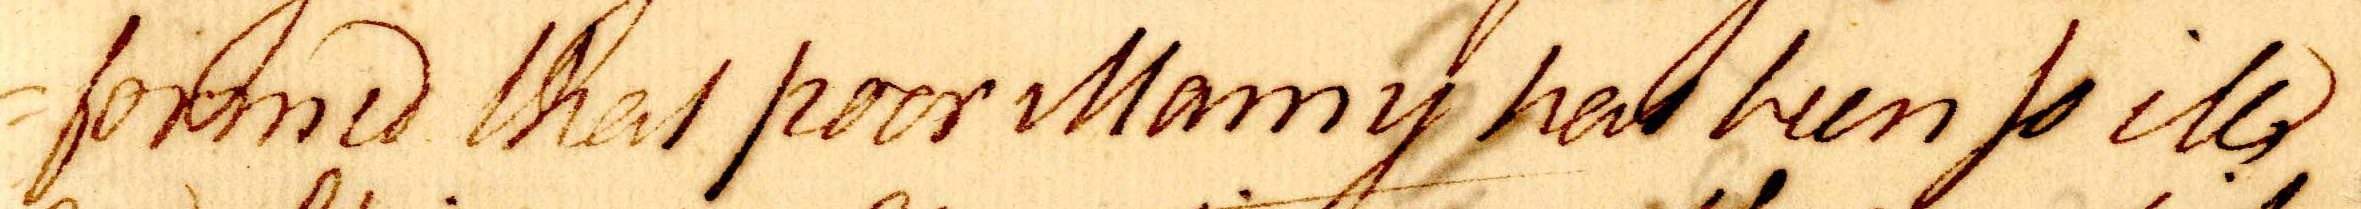-formed that poor Mamy has been so ill.
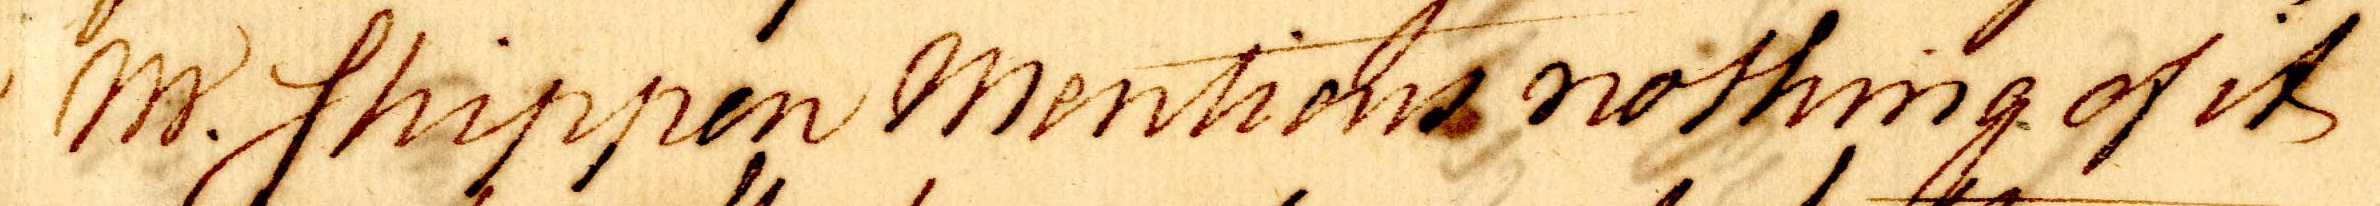M. Shippen Mentions nothing of it
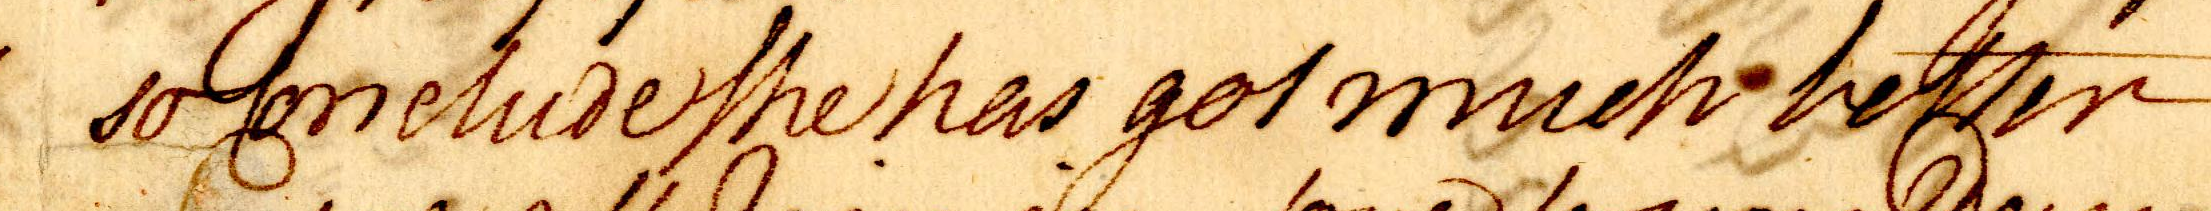so conclude she has got much better
